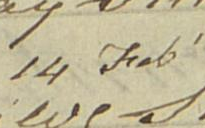14 Feb
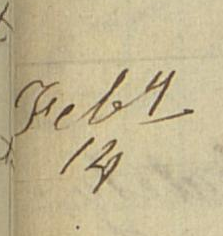Feb 4
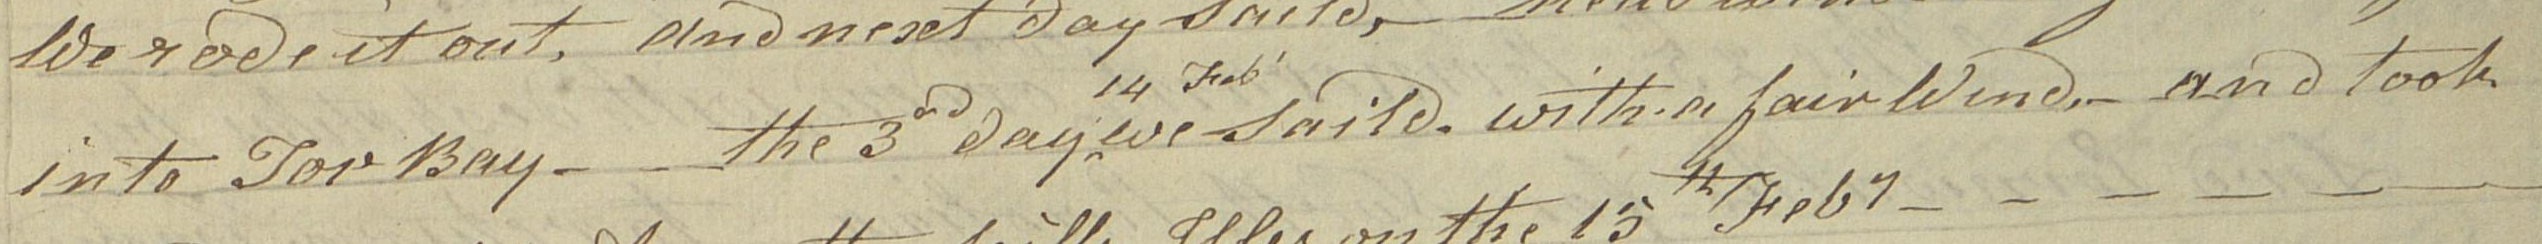into Tor Bay-- The 3^d day ^ we saild. with a fair Wind, and took
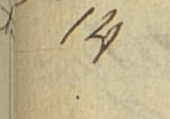14
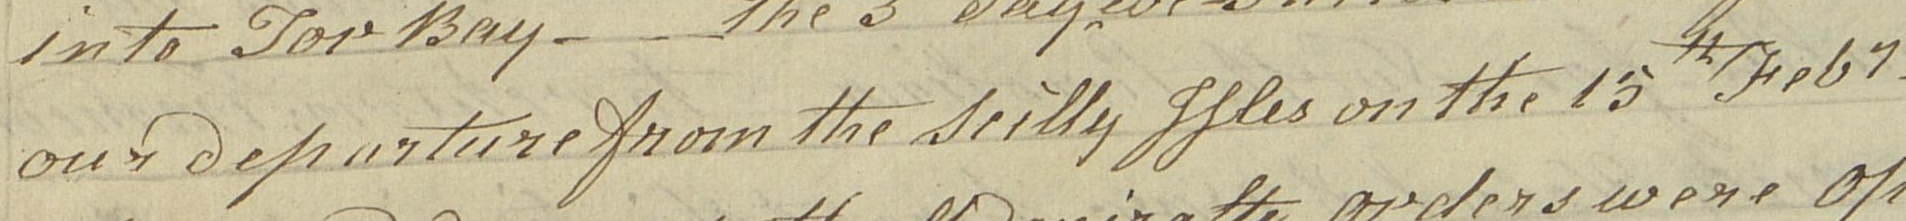our departure from the Scilly Isles on the 15^th Feb^y.
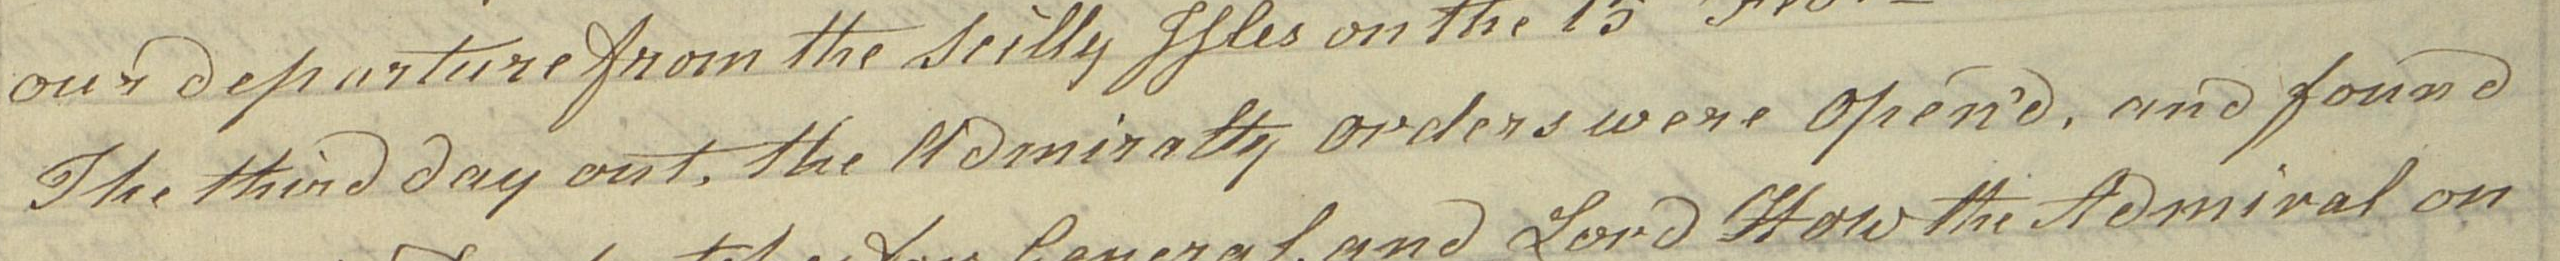The third day out, the Admiralty orders were open'd, and found
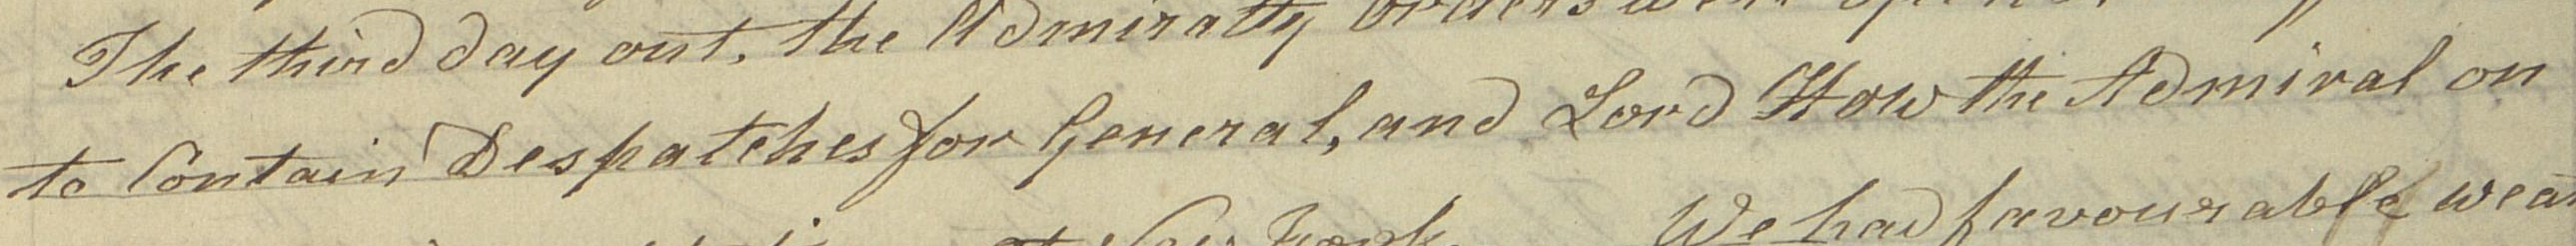to Contain Despatches for General, and Lord How the Admiral on
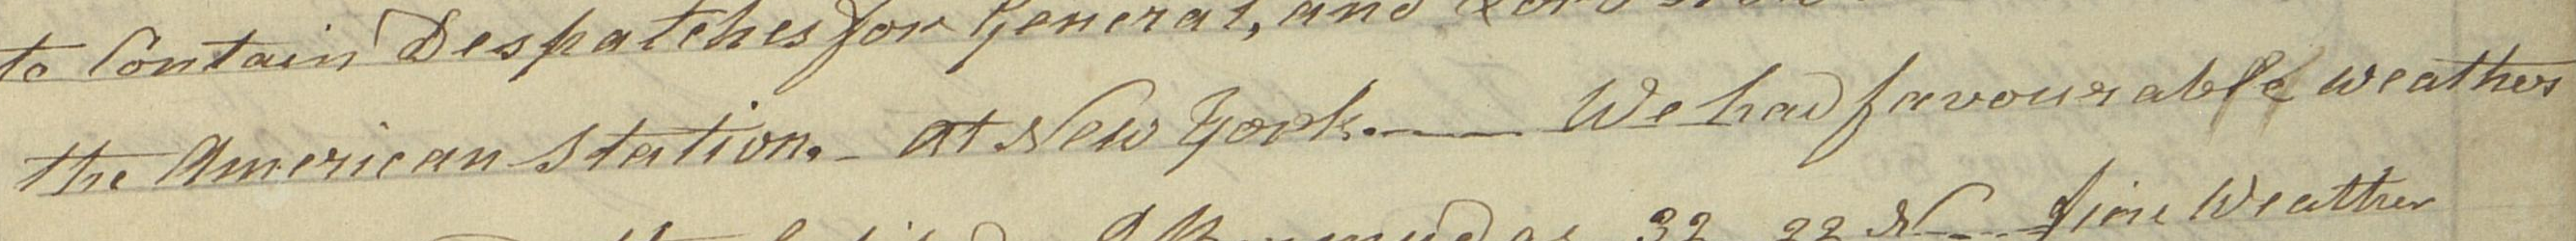the American Station. At New York.- We had favourable weather
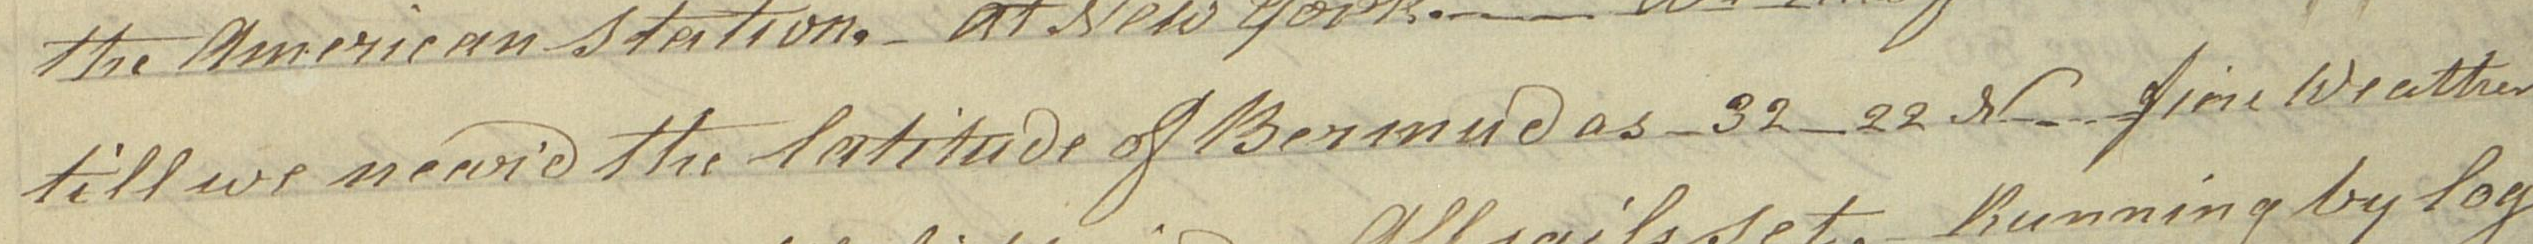till we neard the latitude of Bermudas 32 22 N fine Weather
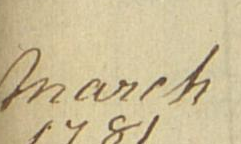March
